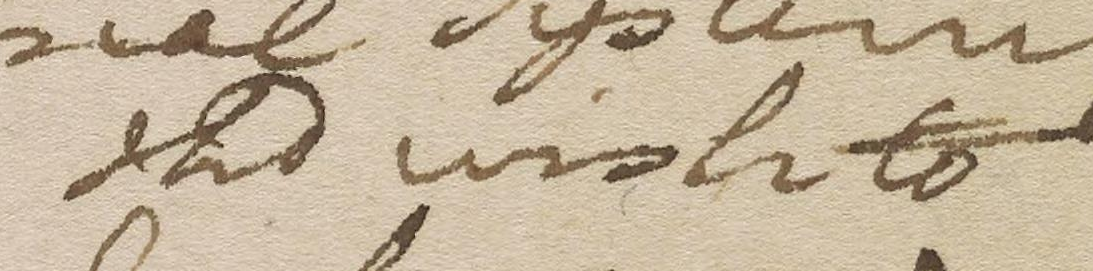I wish to
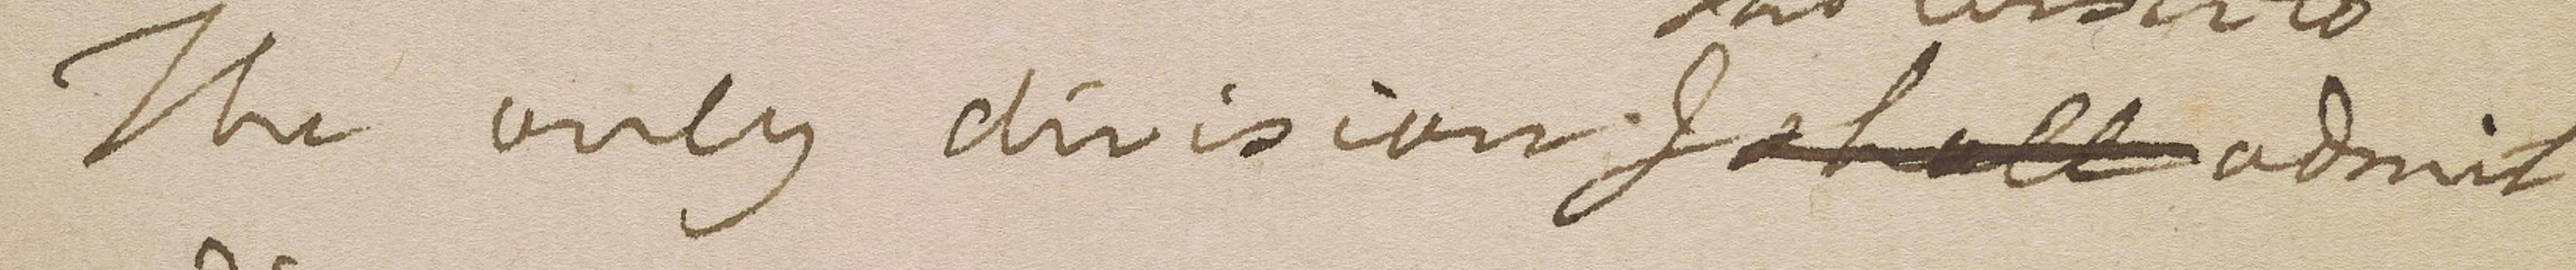The only division I [shall] admit
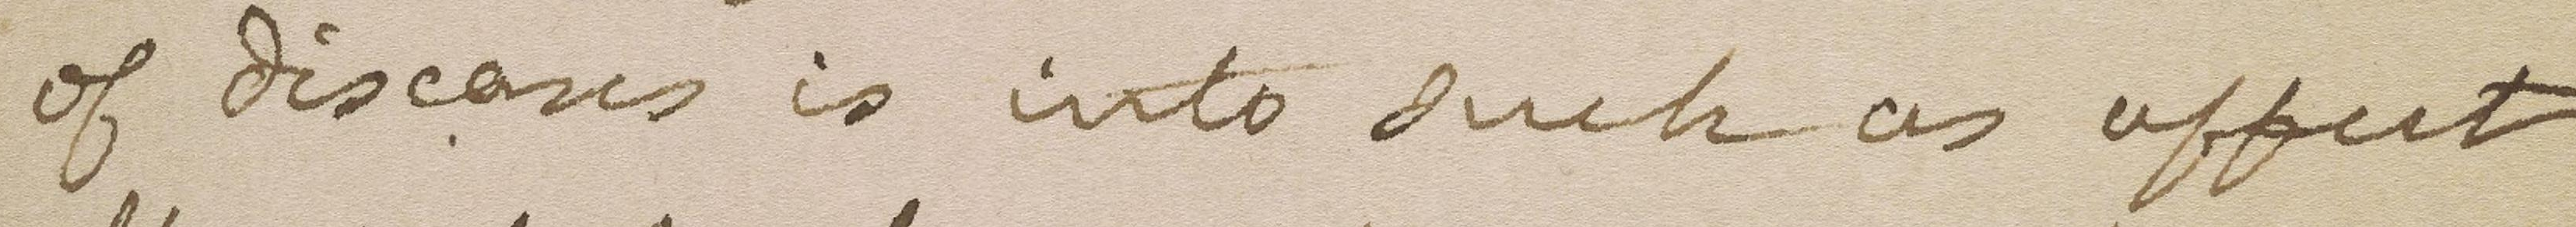of diseases is into such as affect
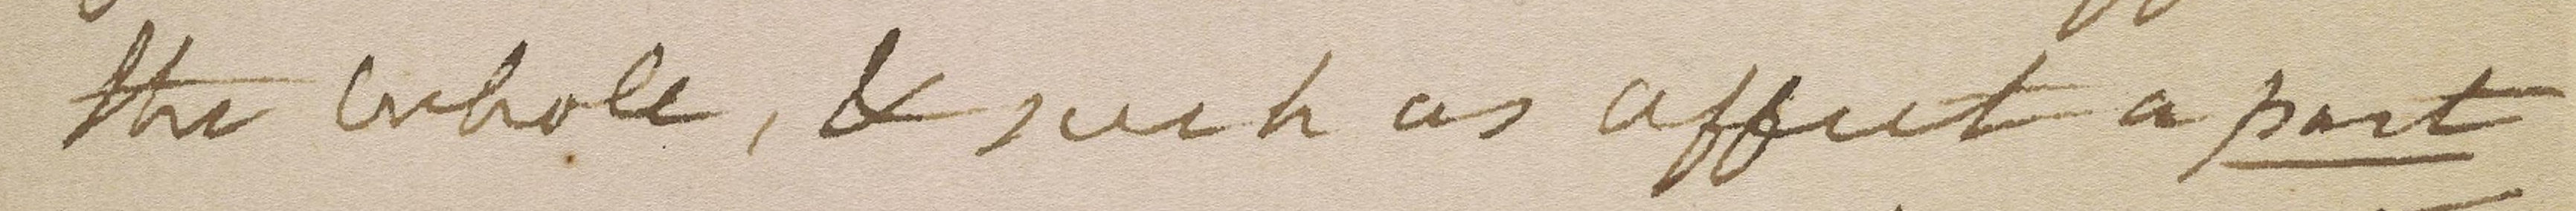the whole, & such as affect a part
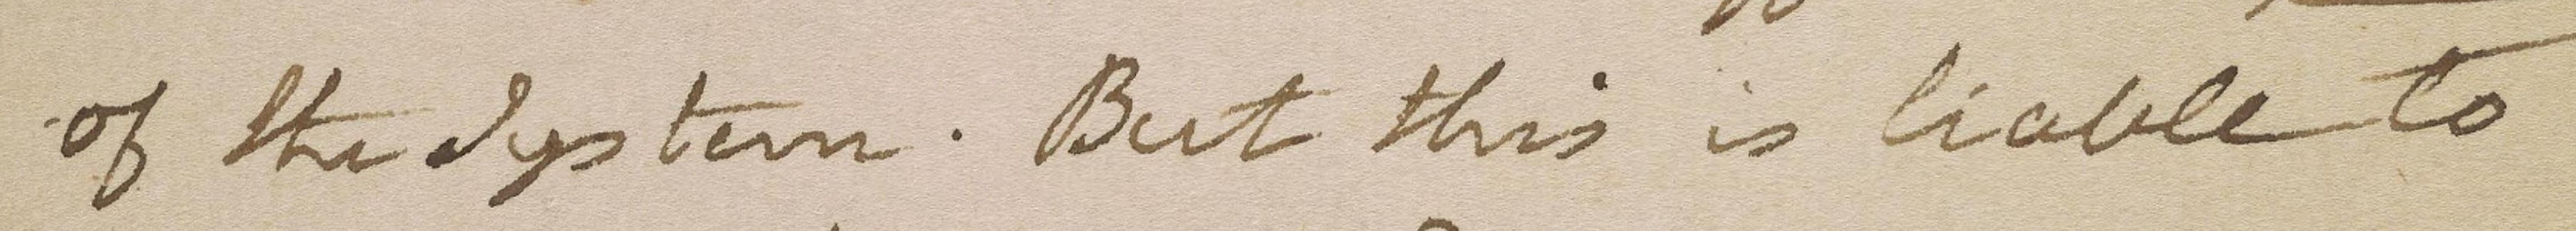of the system. But this is liable to
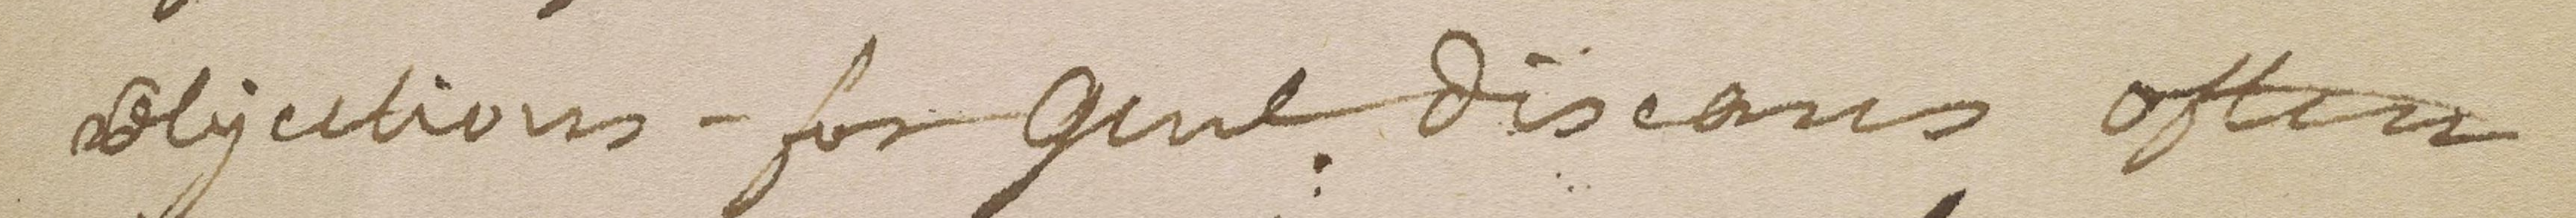objections- for gen^l. diseases often
